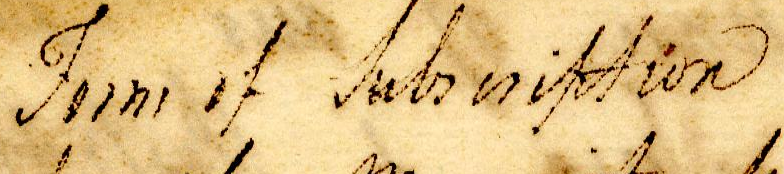Form of Subscription
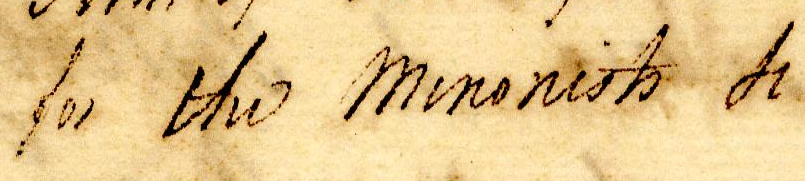for the Menonists &c.
